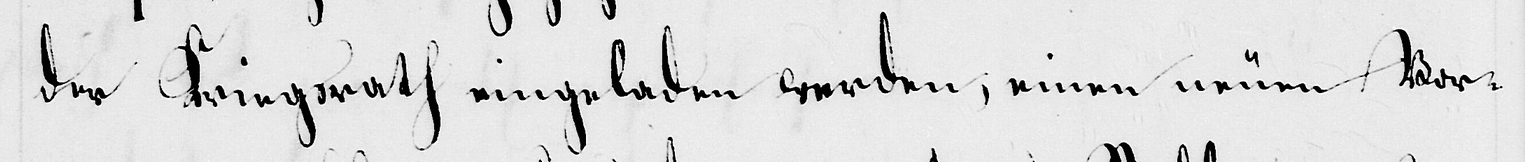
der Kriegsrath eingeladen werden, einen neuen Vor¬
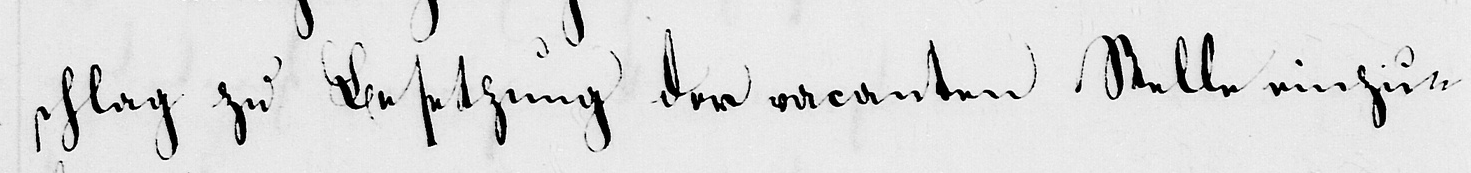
schlag zu Besetzung der vacanten Stelle einzu¬
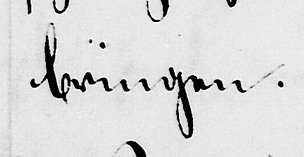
bringen.
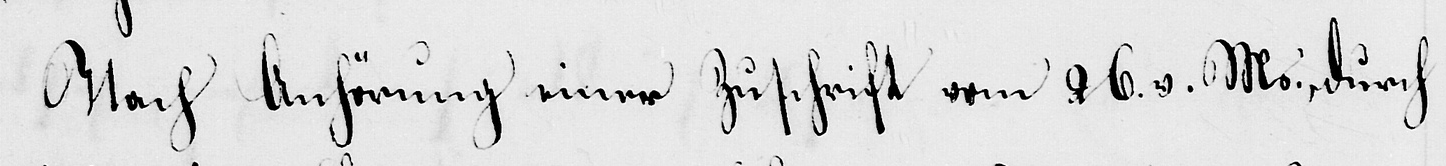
Nach Anhörung einer Zuschrift vom 26. v. Ms. durch
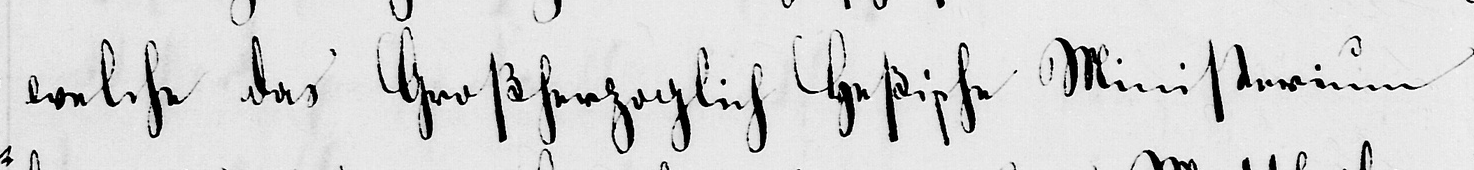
welche das Großherzoglich Heßische Ministerium
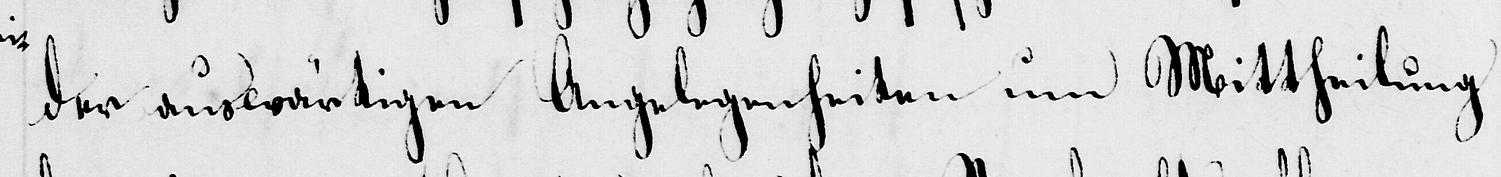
der auswärtigen Angelegenheiten um Mittheilung
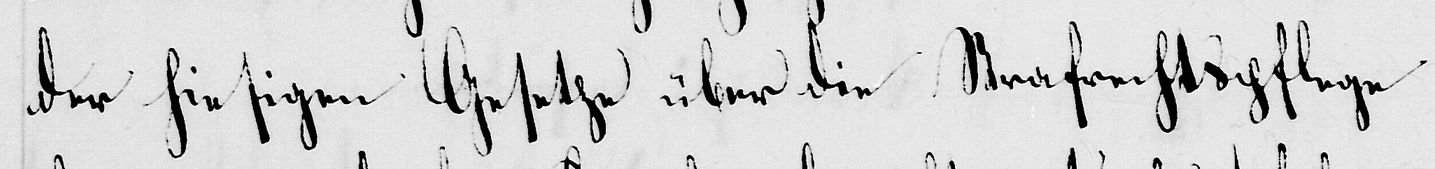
der hiesigen Gesetze über die Strafrechtspflege
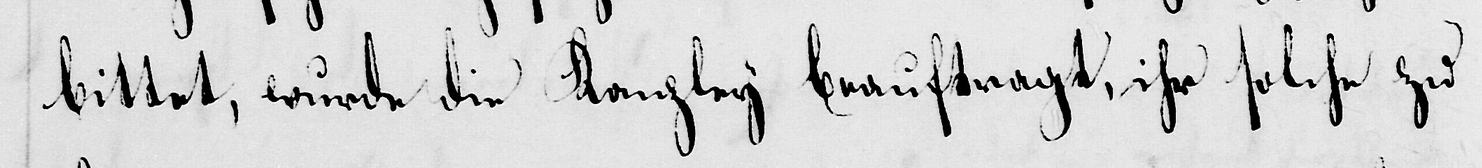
bittet, wurde die Kanzley beauftragt, ihr solche zu
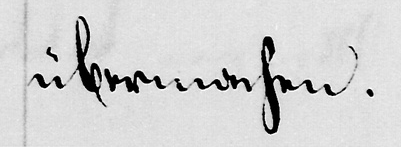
übermachen.
